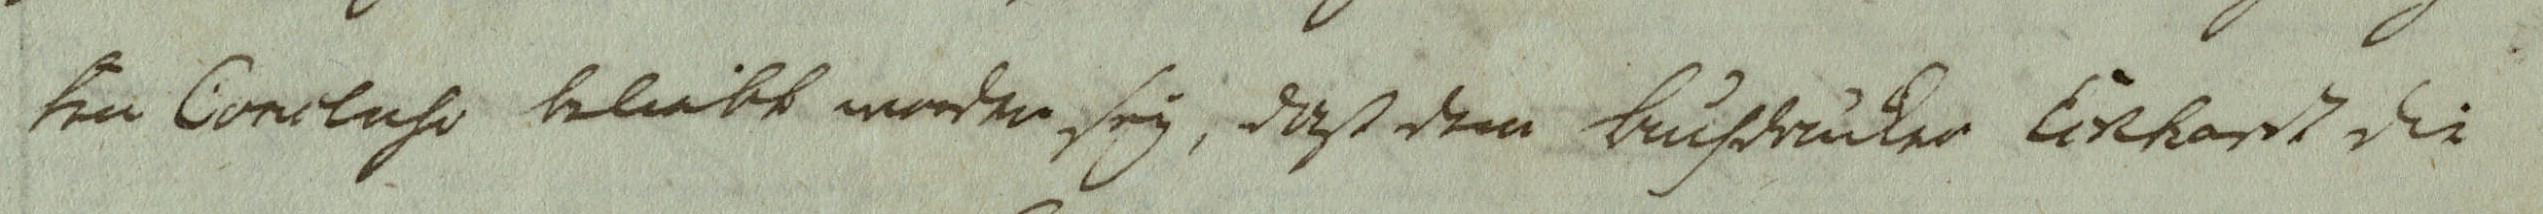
ten Concluso beliebt worden seÿ, daß dem Buchdrucker Eckhardt die
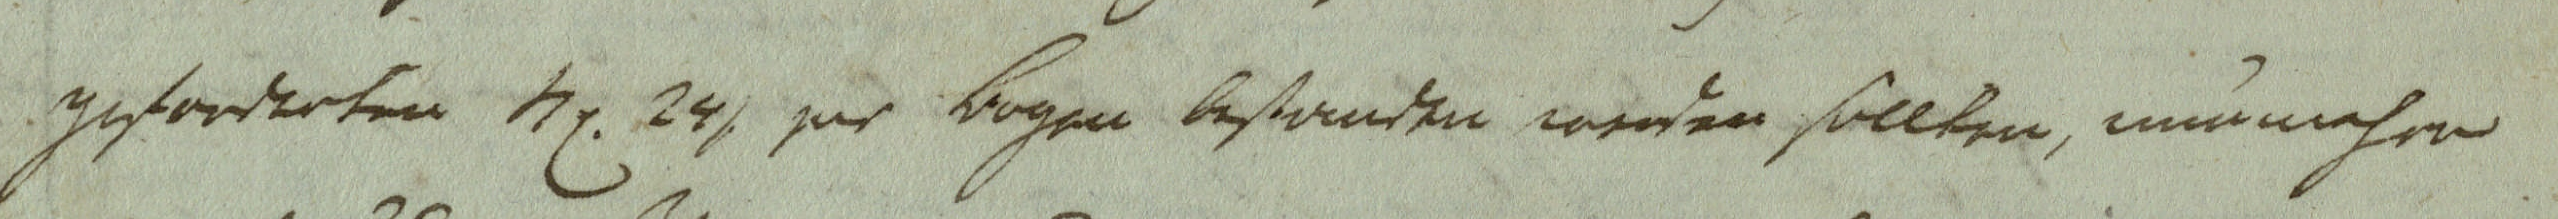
geforderten 4l. 24 s. per Bogen bestanden werden sollten, nunmehro
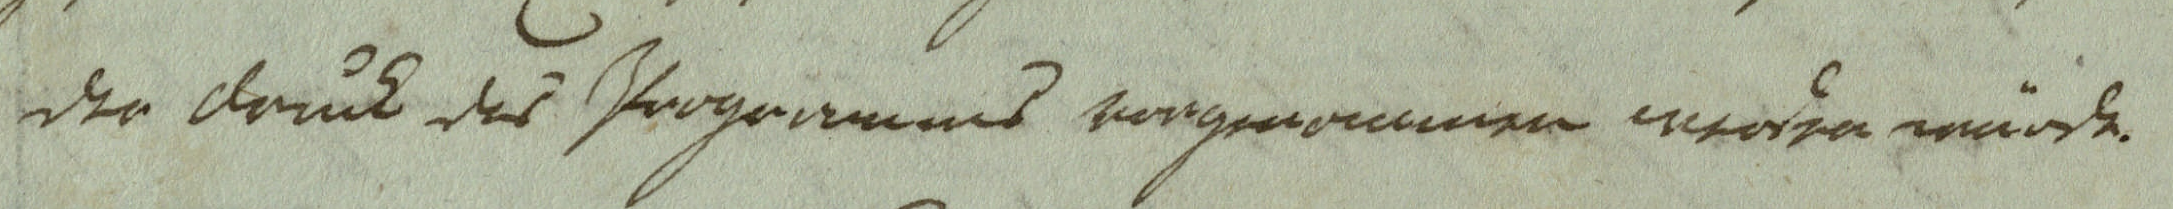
der Druck des Programms vorgenommen werden würde.
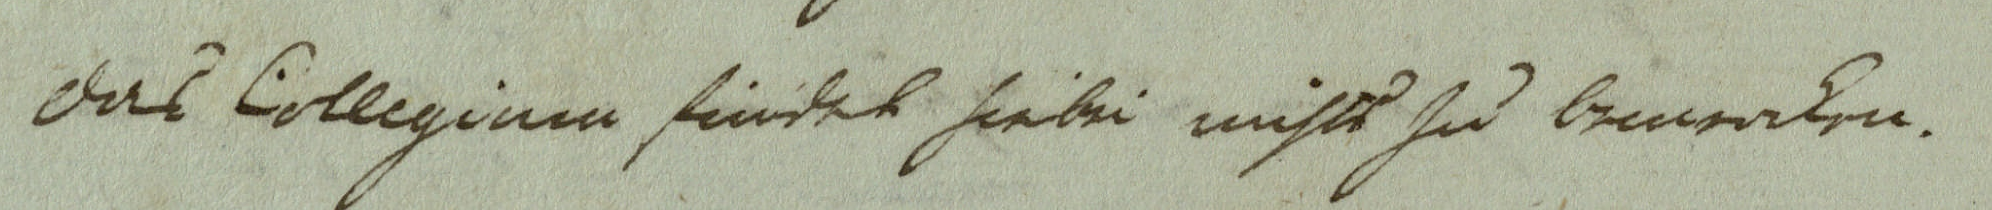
Das Collegium findet hiebei nichts zu bemercken.
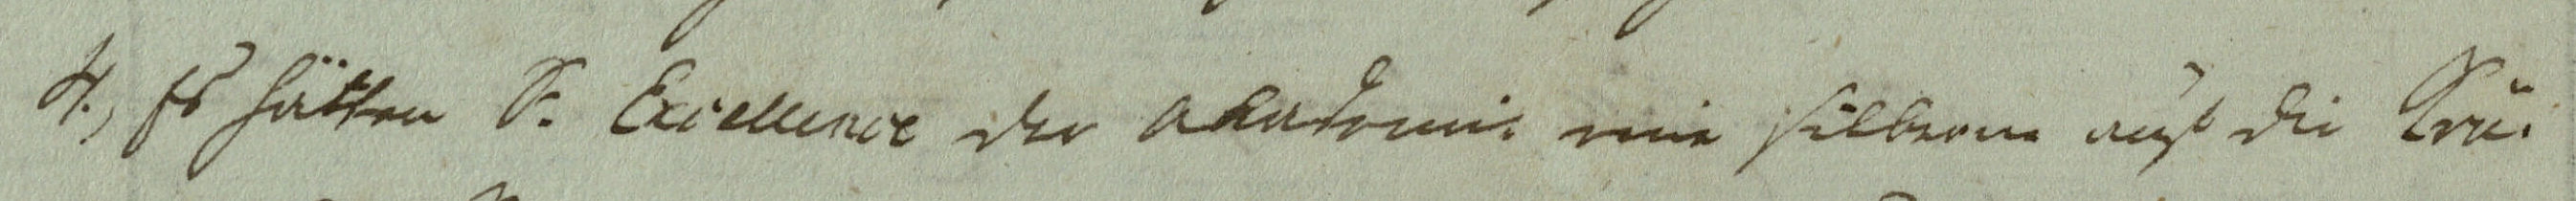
4. Es hätten Sr. Excellence der Akademie eine silberne auf die Krö¬
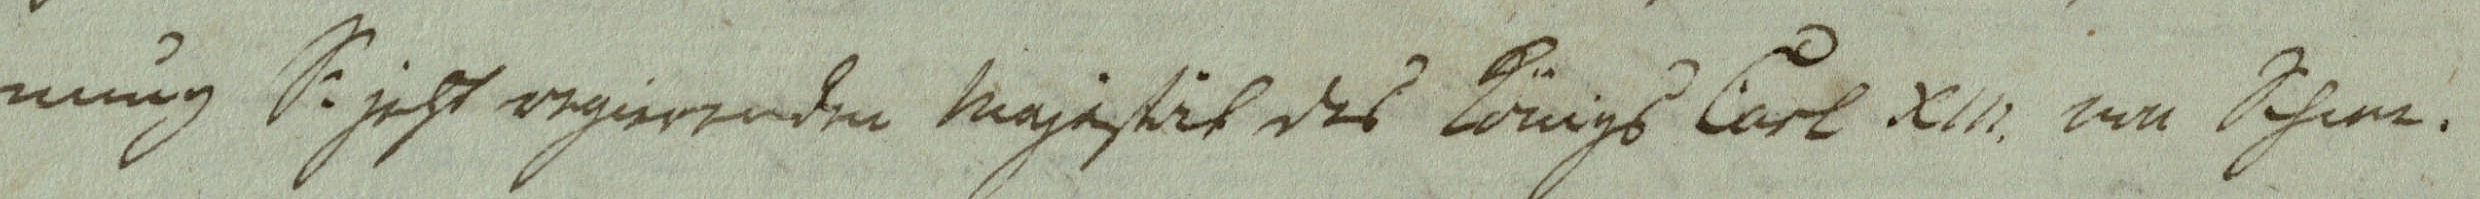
nung Sr. jetzt regierenden Majestät des Königs Carl XIII. von Schwe¬
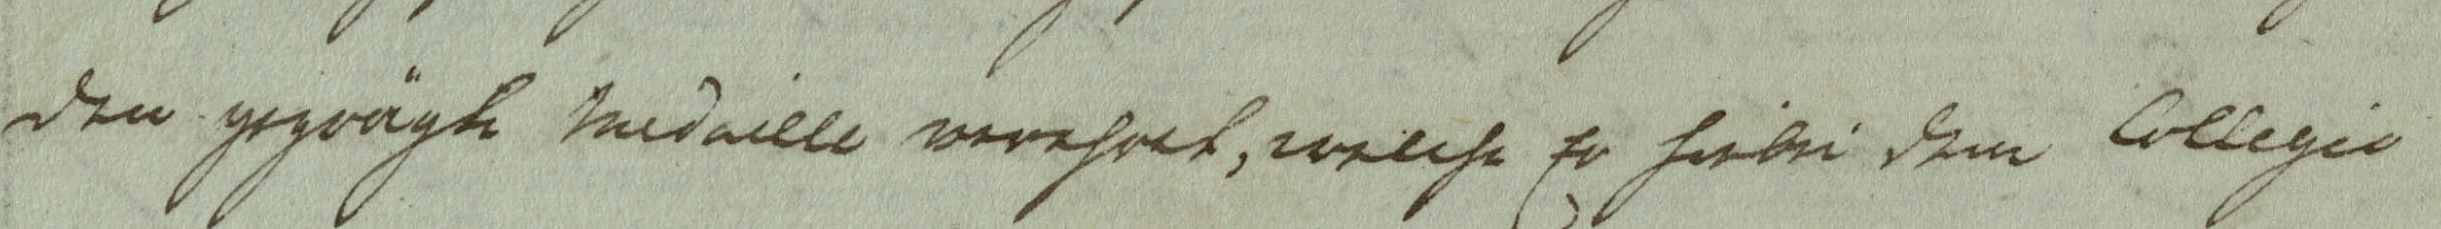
den geprägte Medaille verehret, welche Er hiebei dem Collegio
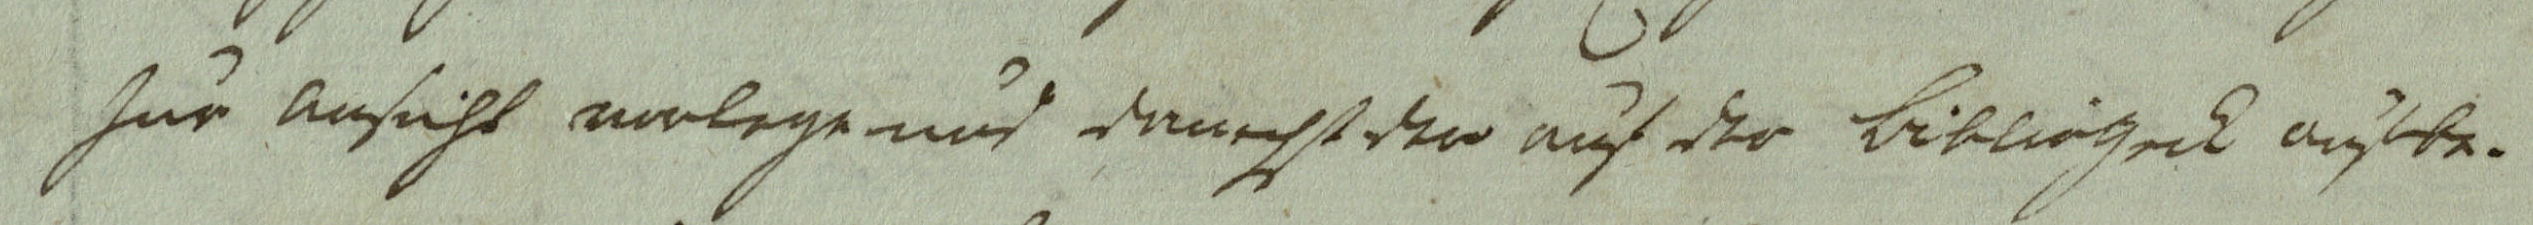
zur Ansicht vorlege und danechst der auf der Bibliotheck aufbe¬
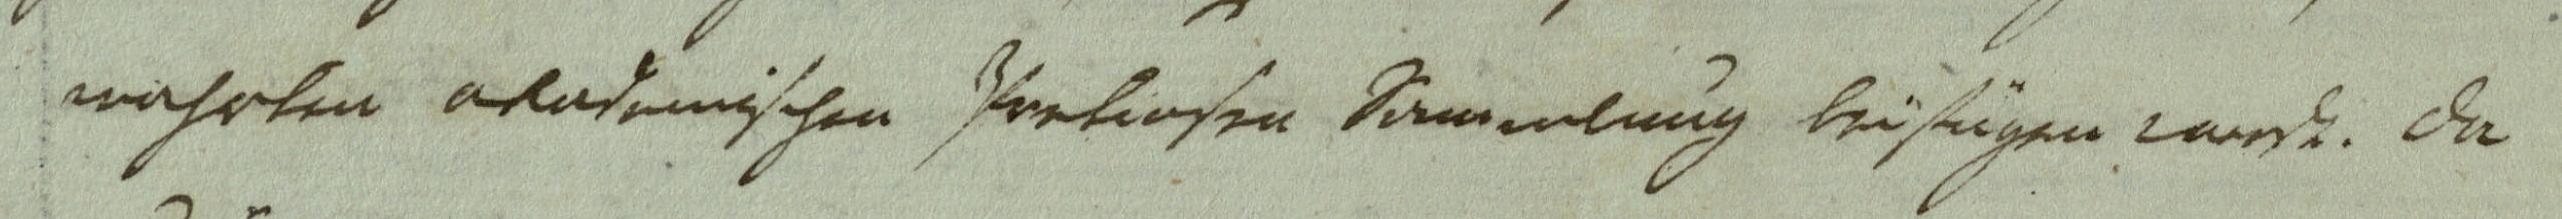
wahrten akademischen Pretiosen Sammlung beifügen werde. Da
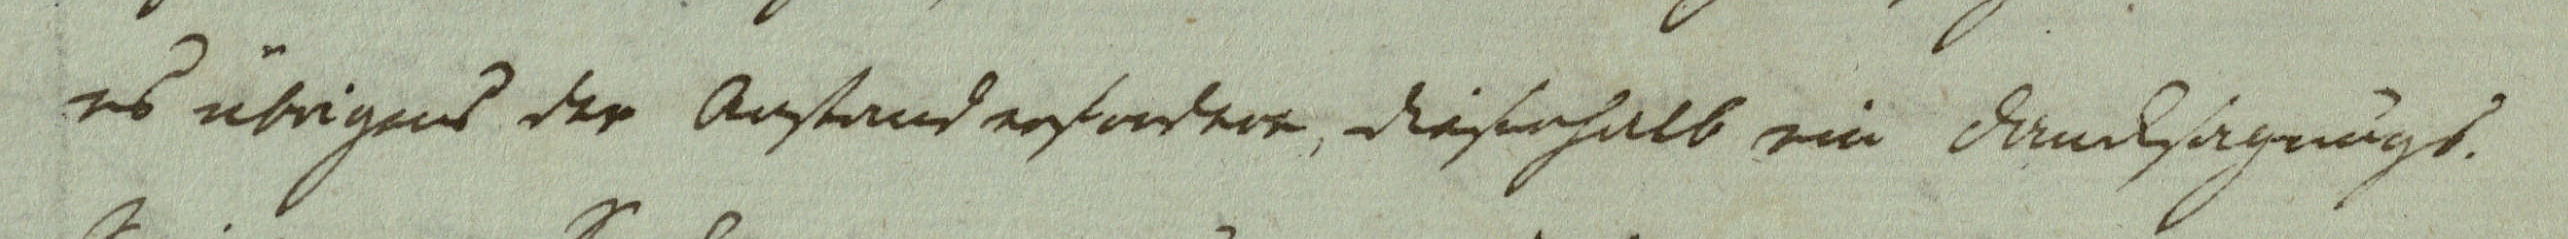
es übrigens der Anstand erfordere, dieserhalb ein Dancksagungs¬
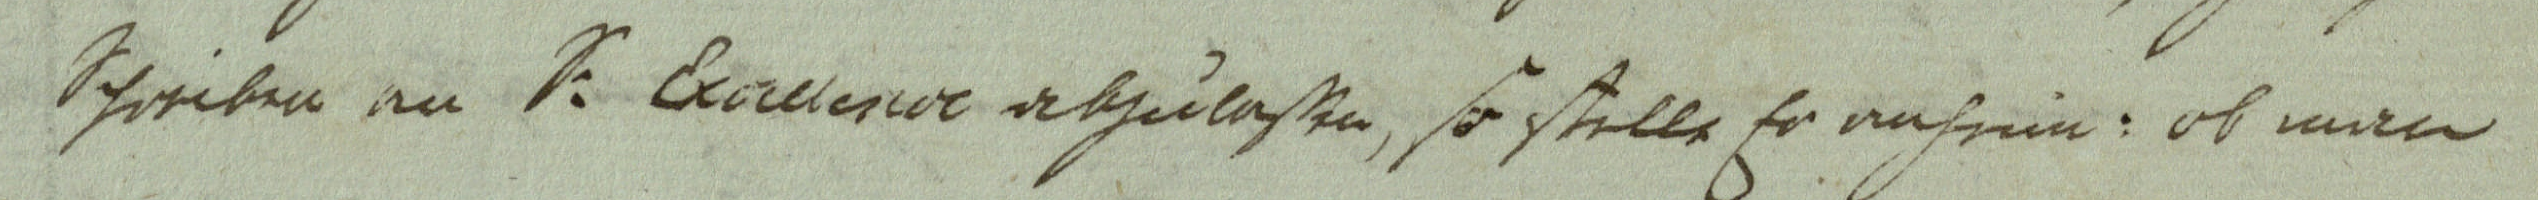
Schreiben an Sr. Excellence abzulassen, so stelle Er anheim: ob man
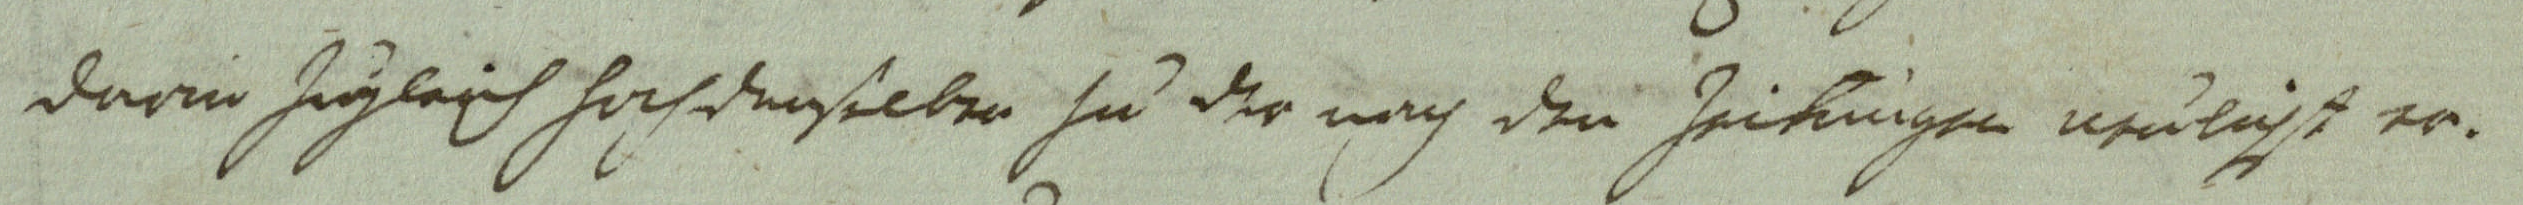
darin zugleich hochdemselben zu der nach den Zeitungen neulichst er¬
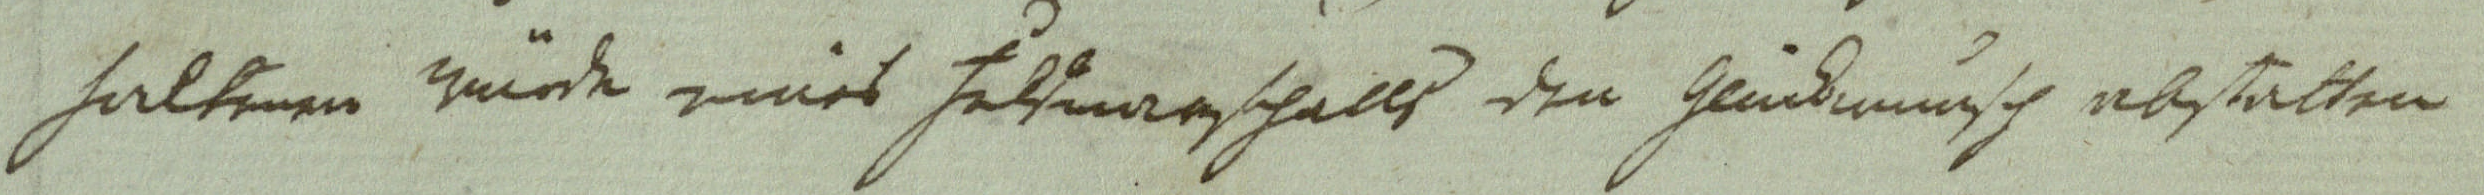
haltenen Würde eines Feldmarschalls den Glückwunsch abstatten
